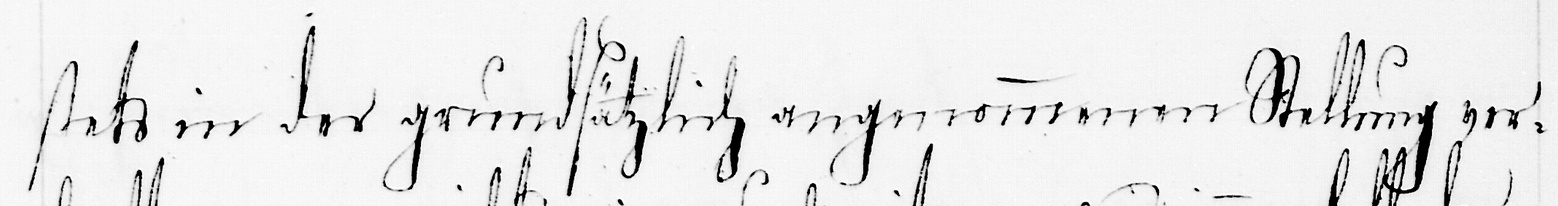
stets in der grundsätzlich angenommenen Stellung ver¬
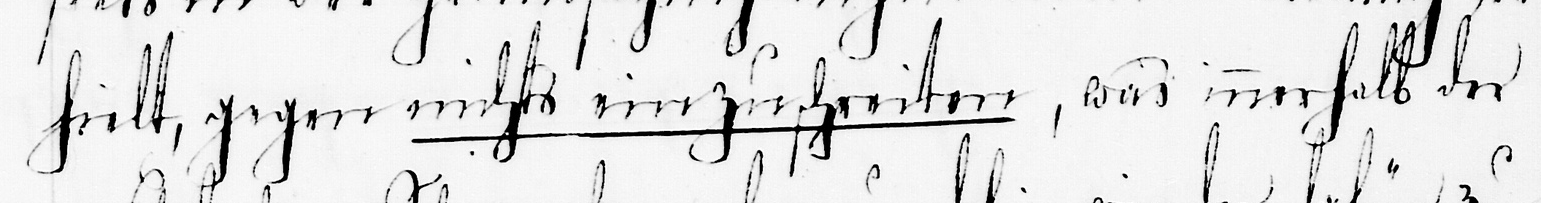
hielt, gegen nichts einzuschreiten, was innerhalb der
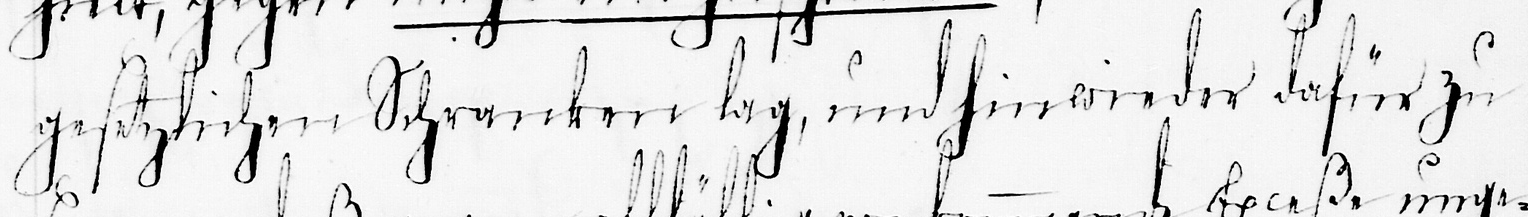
gesetzlichen Schranken lag, und hinwieder dafür zu
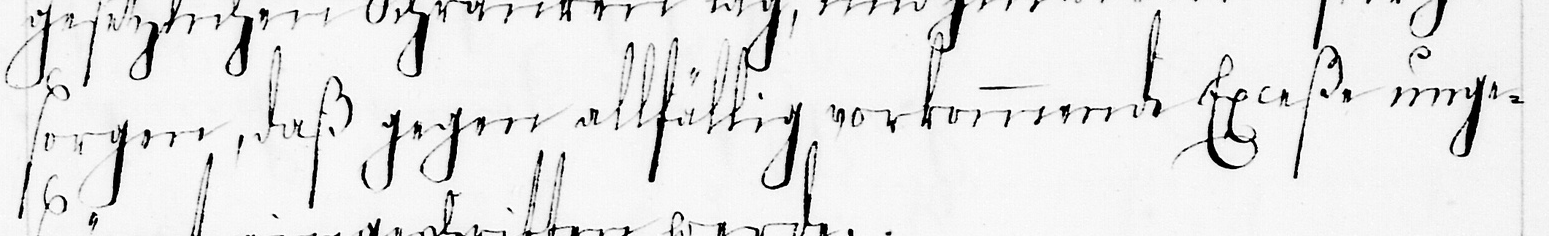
sorgen, daß gegen allfällig vorkommende Exceße unge¬
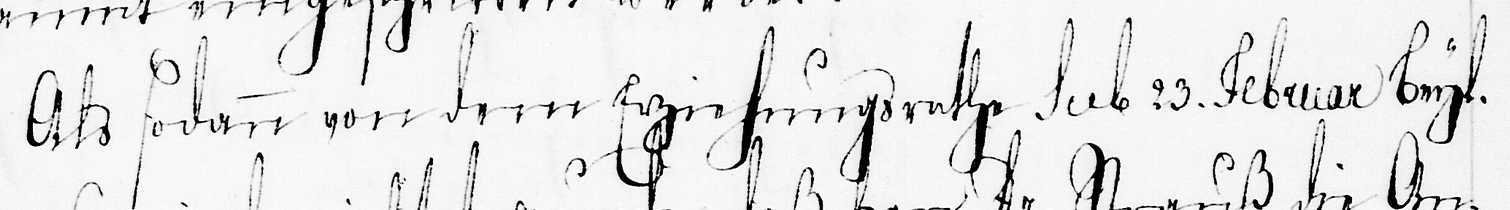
Als sodann von dem Erziehungsrathe sub 23. Februar Beyl.
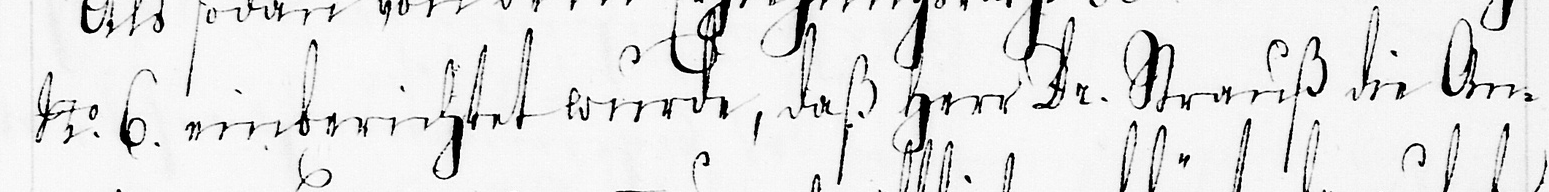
No. 6. einberichtet wurde, daß Herr Dr. Strauß die An¬
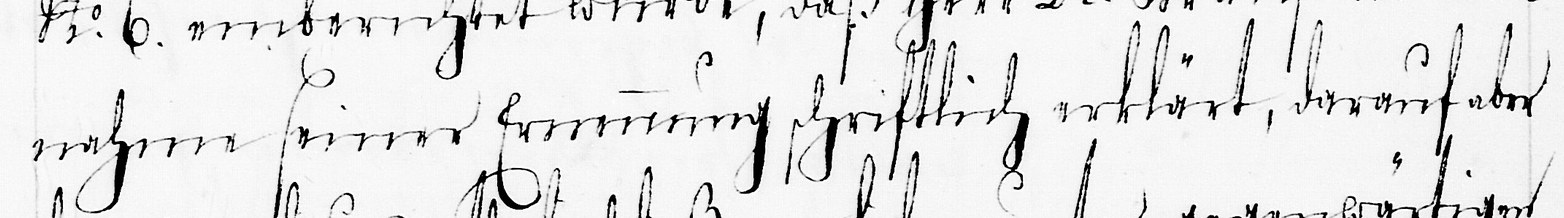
nahme seiner Ernennung schriftlich erklärt, darauf aber
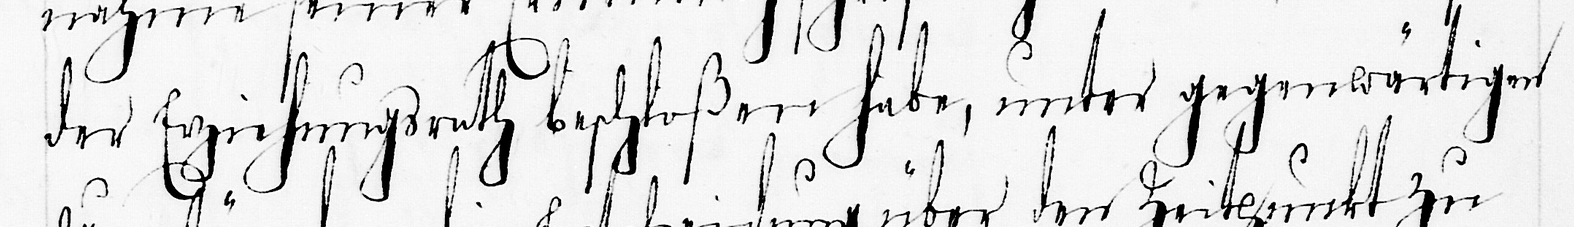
der Erziehungsrath beschloßen habe, unter gegenwärtigen
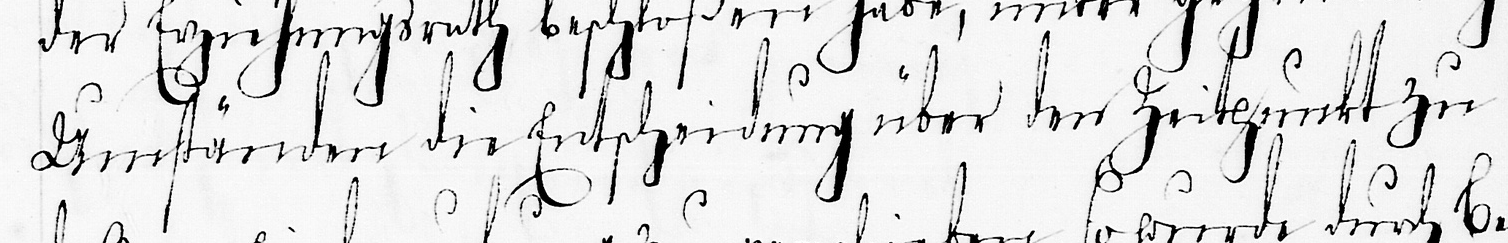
Umständen die Entscheidung über den Zeitpunkt zu
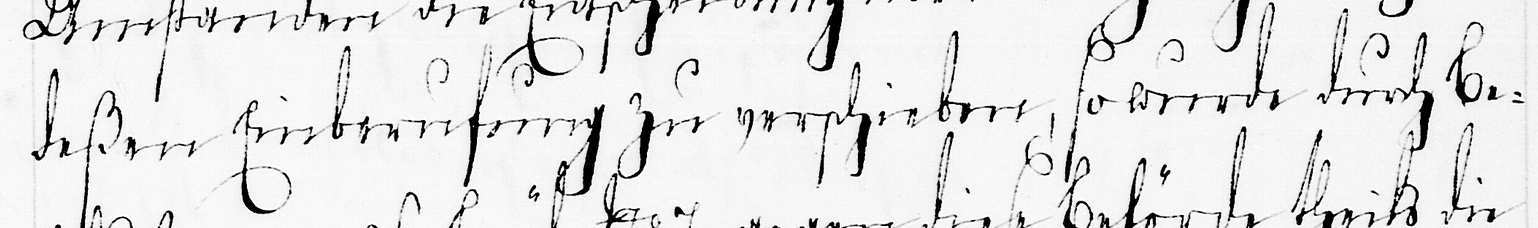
deßen Einberufung zu verschieben, so wurde durch Be¬
